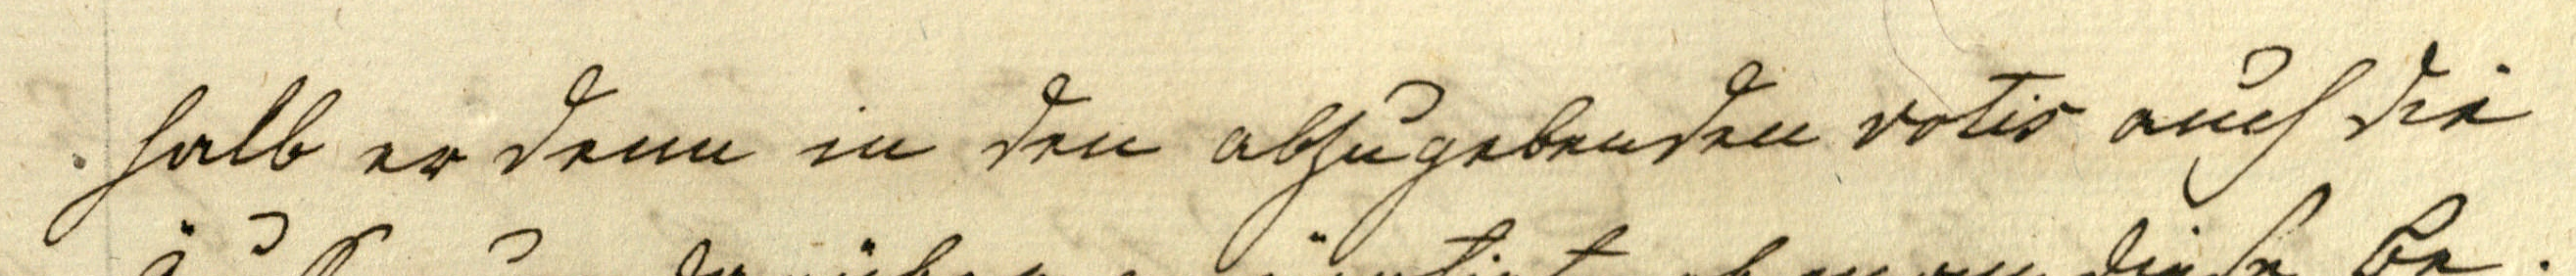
halb er denn in den abzugebenden votis auch die
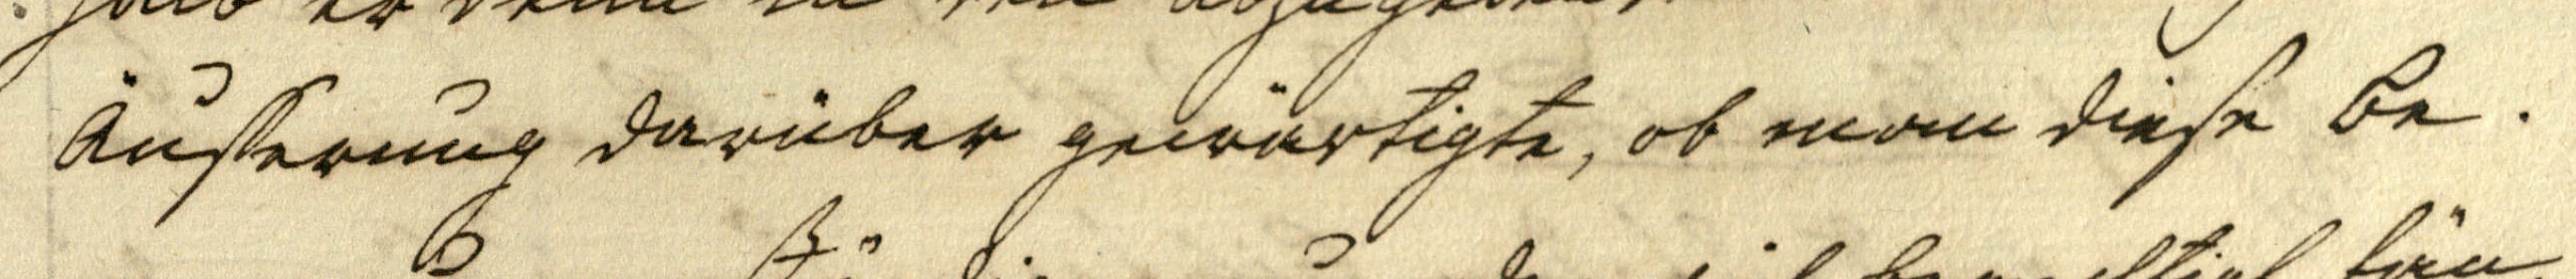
Äusserung darüber gewärtigte, ob man diese Be-
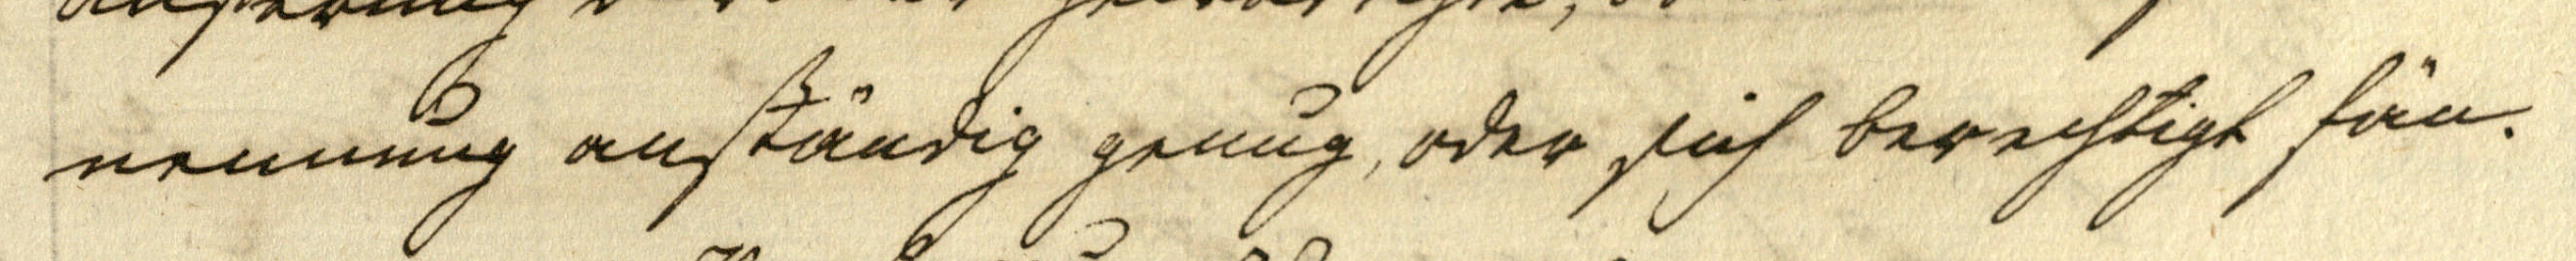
nennung anständig genug, oder sich berechtigt fän-
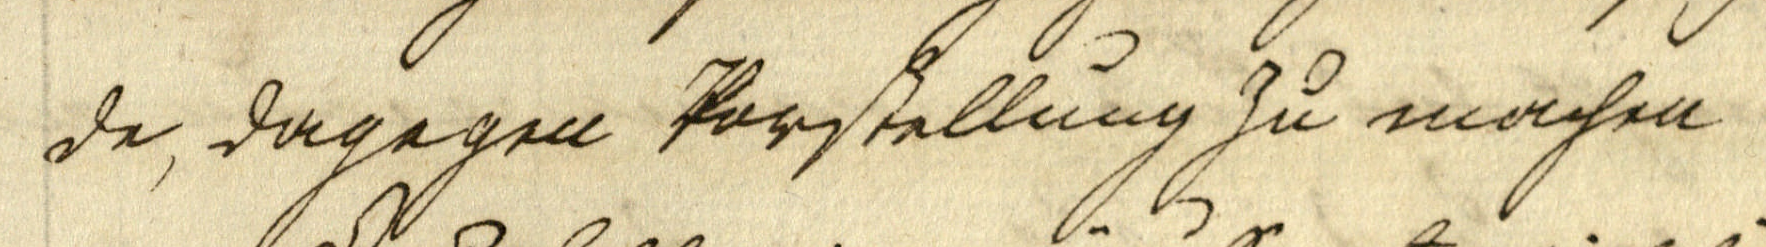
de, dagegen Vorstellung zu machen.
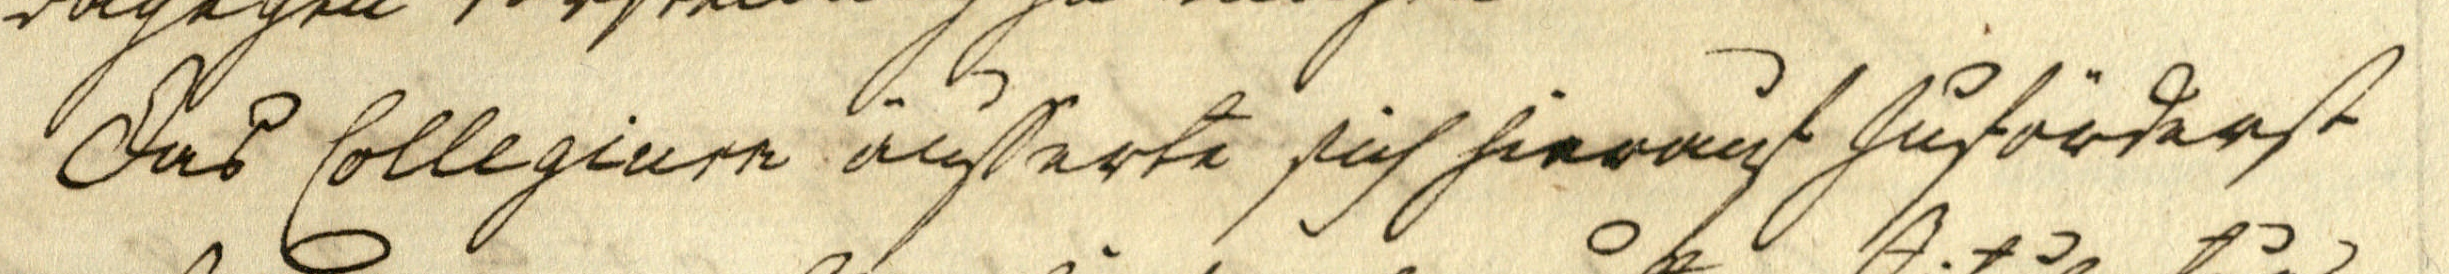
Das Collegium äusserte sich hierauf zuförderts
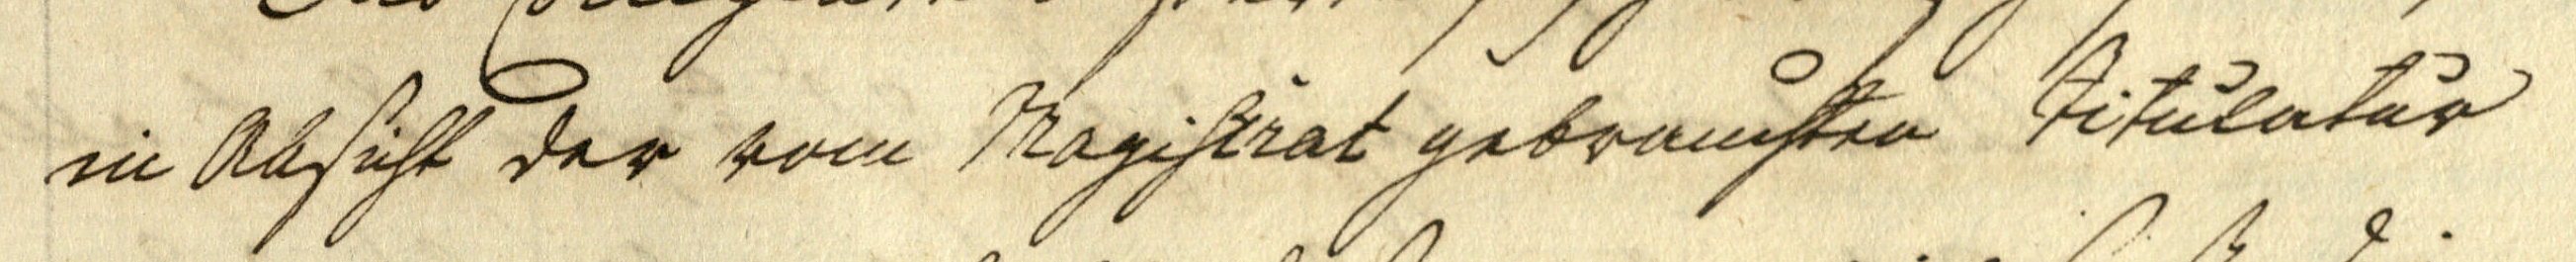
in Absicht der vom Magistrat gebrauchten Titulatur
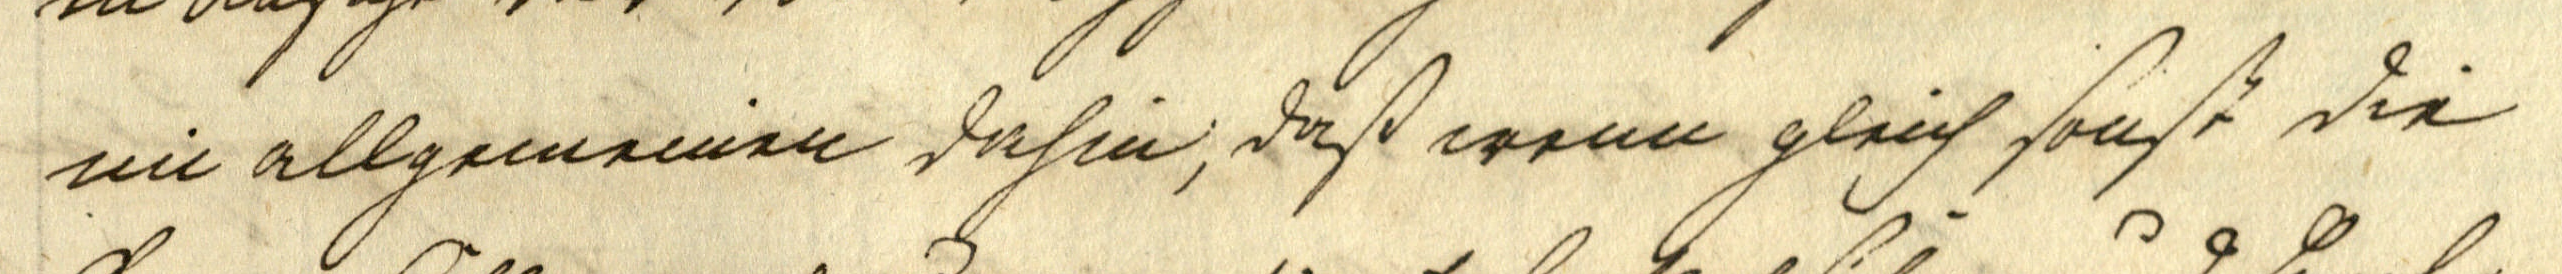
im allgemeinen dahin, daß wenn gleich sonst die
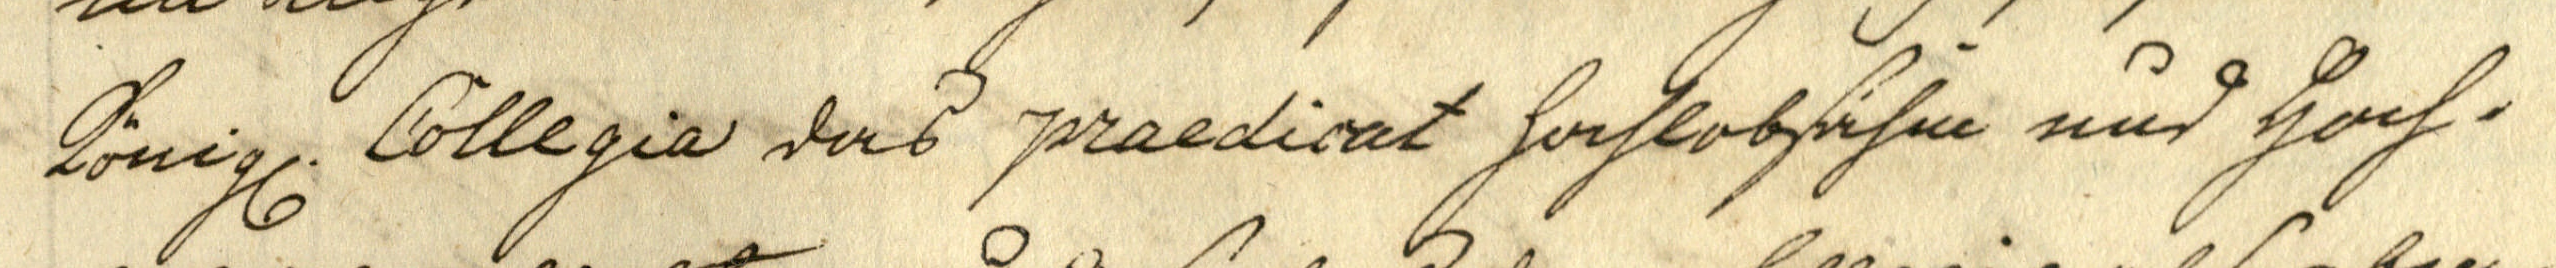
Königl. Collegia das praedicat hochlobsahm und hoch-
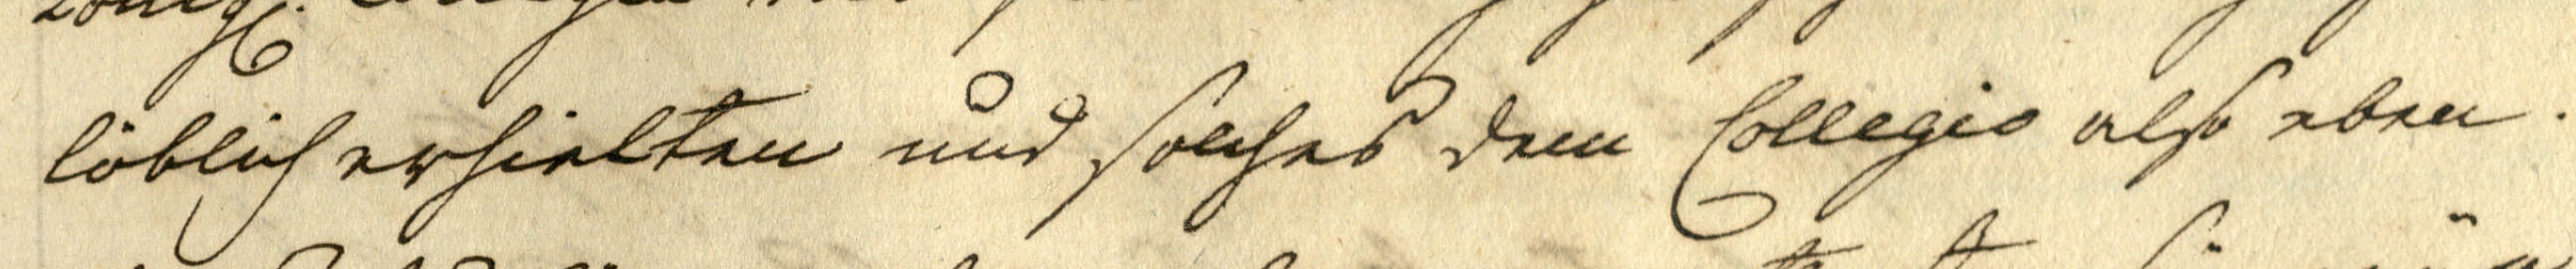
löblich erhielten und solches dem Collegio also eben-
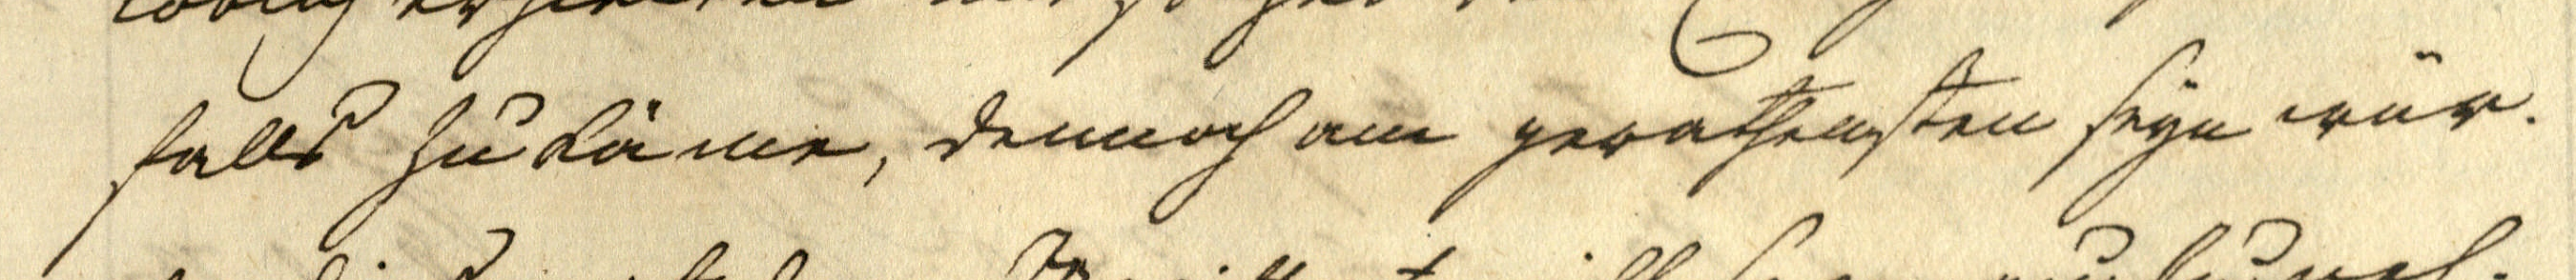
falls zukäme, dennoch am gerathensten seyn wür-
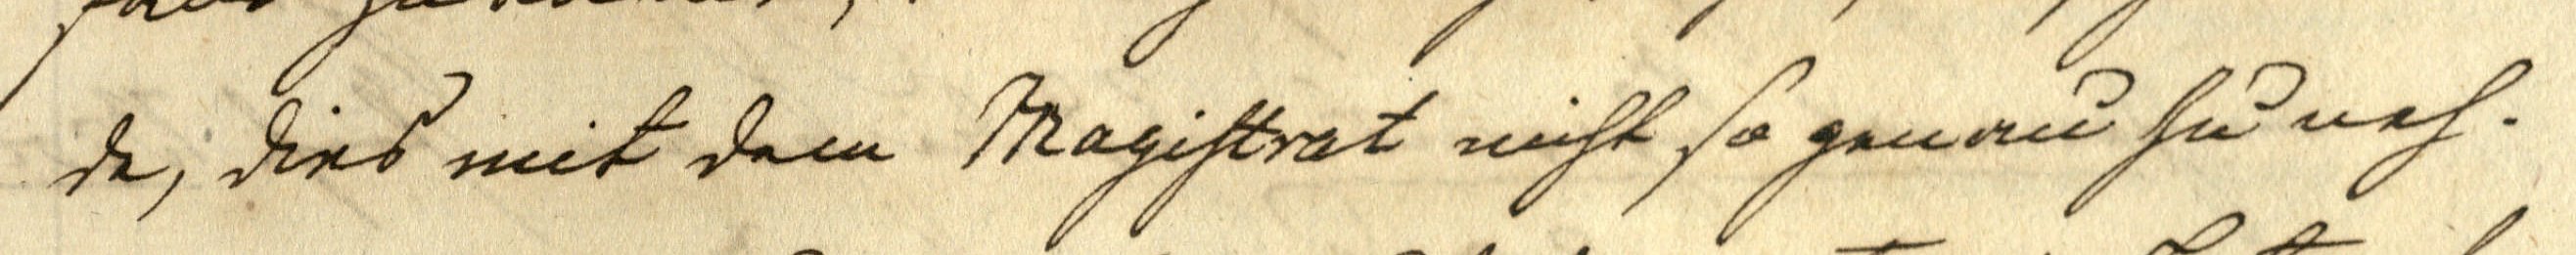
de, dies mit dem Magistrat nicht so genau zu neh-
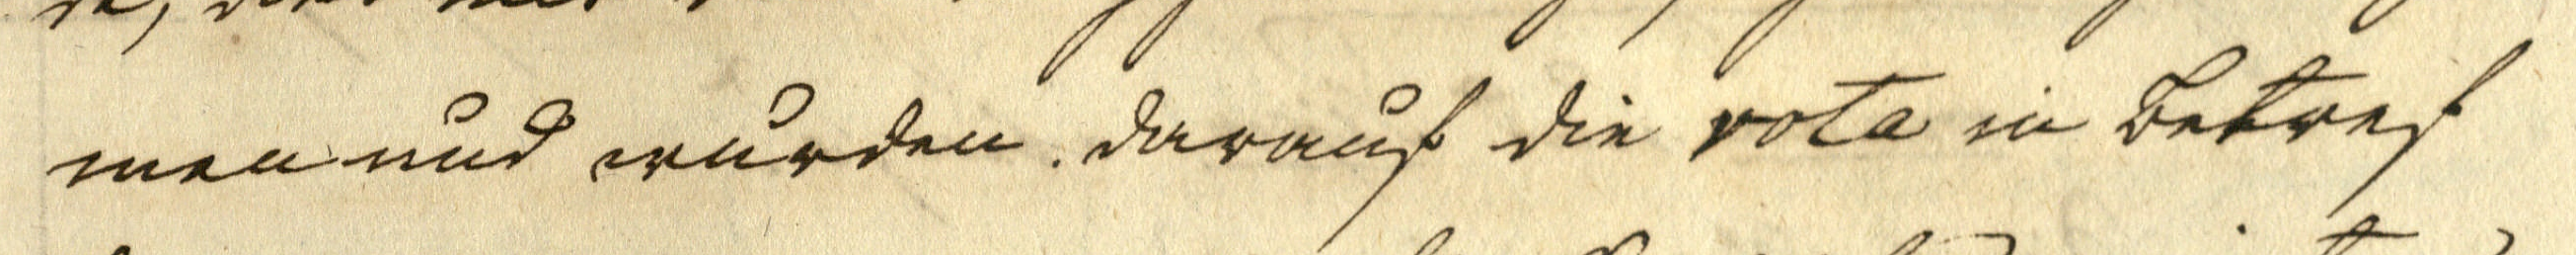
men und wurden darauf die vota in Betref
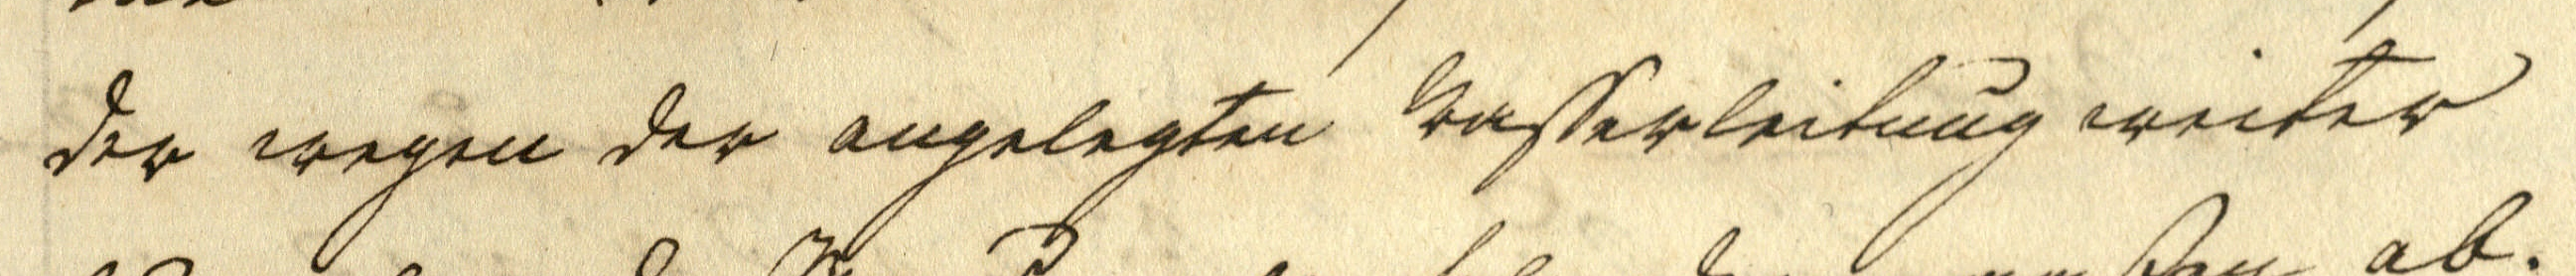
der wegen der angelegten Wasserleitung weiter
